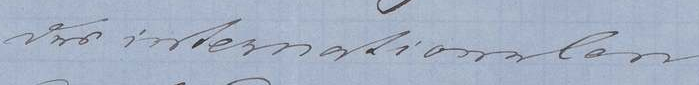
des internationalen
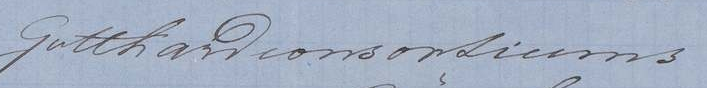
Gotthardconsortiums
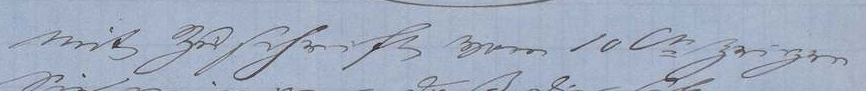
Mit Zuschrift vom 10 Ct zeigen
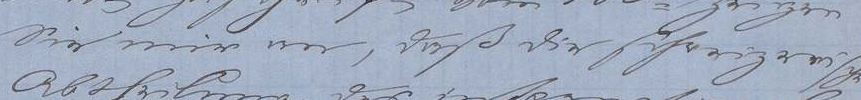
Sie mir an, daß die schweizerische
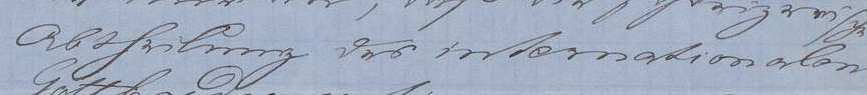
Abtheilung des internationalen
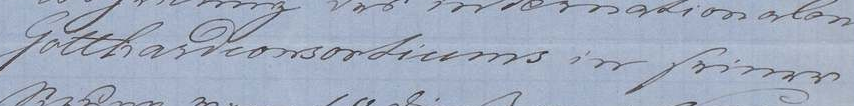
Gotthardconsortiums in seiner
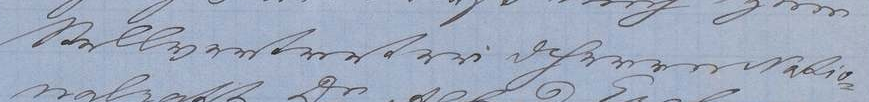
Stellvertreter des Herrn Natio-
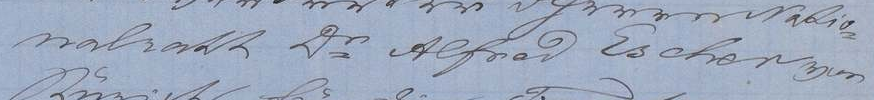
nalrath Dr Alfred Escher von
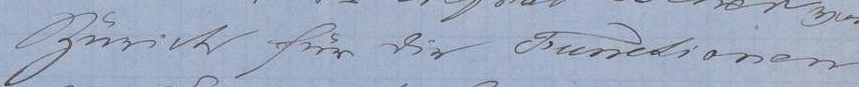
Zürich für die Functionen
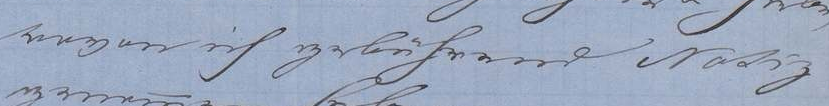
wovon ich gebührend Notiz
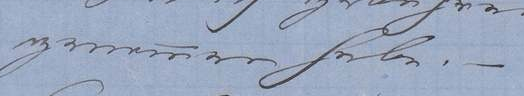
genommen habe. –
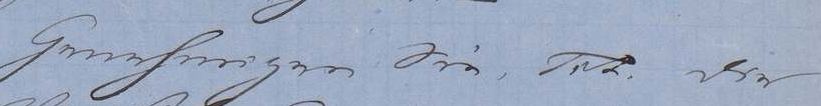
Genehmigen Sie, Tit. die
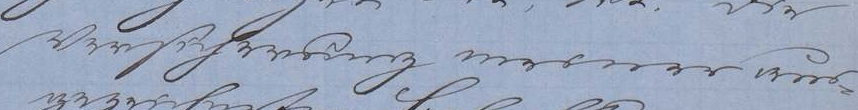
Versicherung meiner aus-
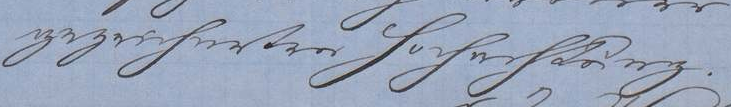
gezeichneten Hochachtung.
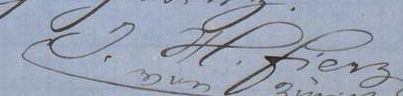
J. H. Fierz
